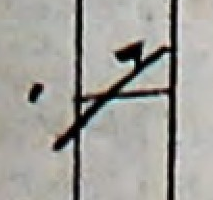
7
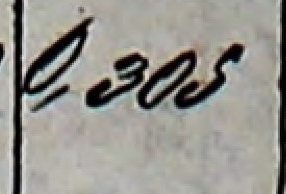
0,305
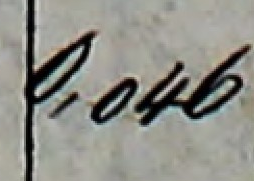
0,046
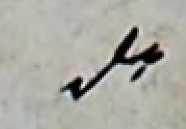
do
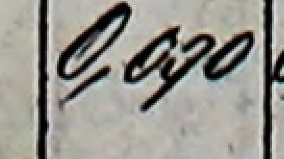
0,090
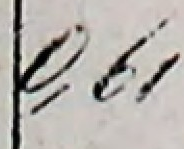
0,61
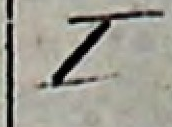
I
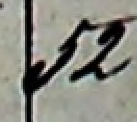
52
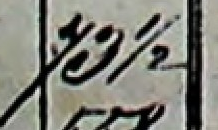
73 1/2
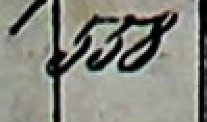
558
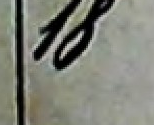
18
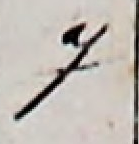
7
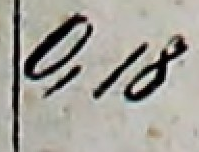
0,18
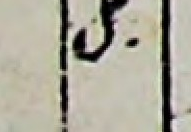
8.
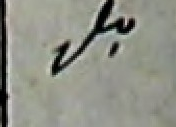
do
